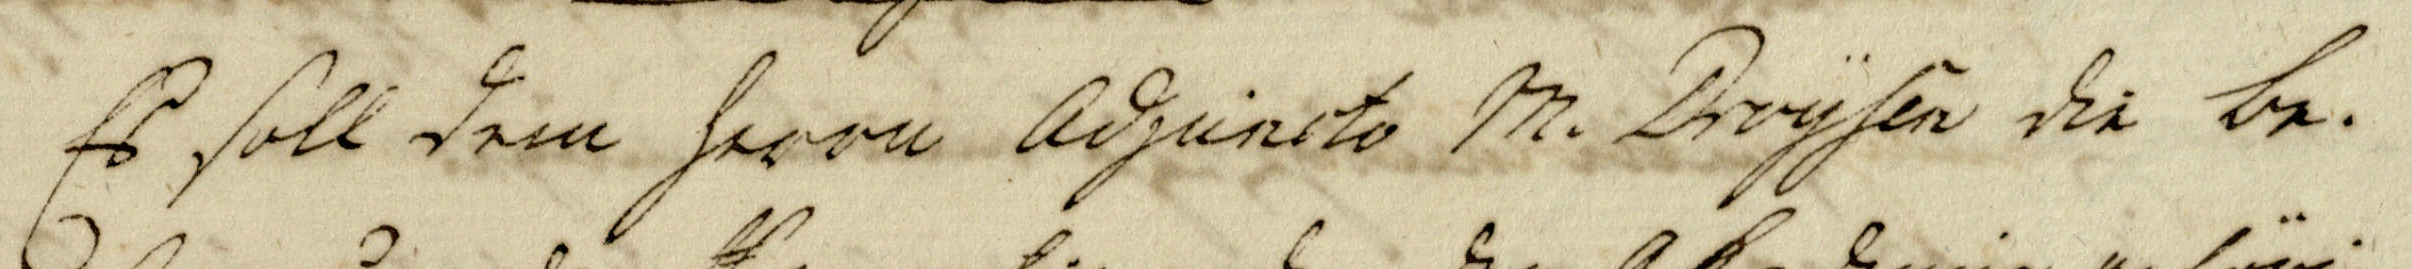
Es soll dem Herrn Adjuncto M. Droÿsen die Be¬
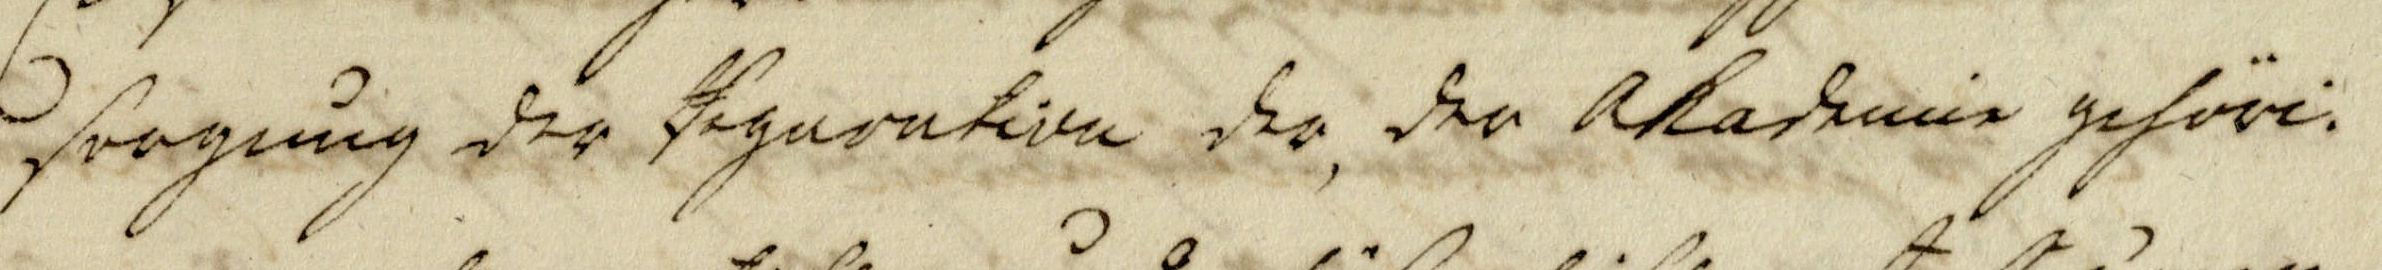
sorgung der Reparation der, der Akademie gehöri¬
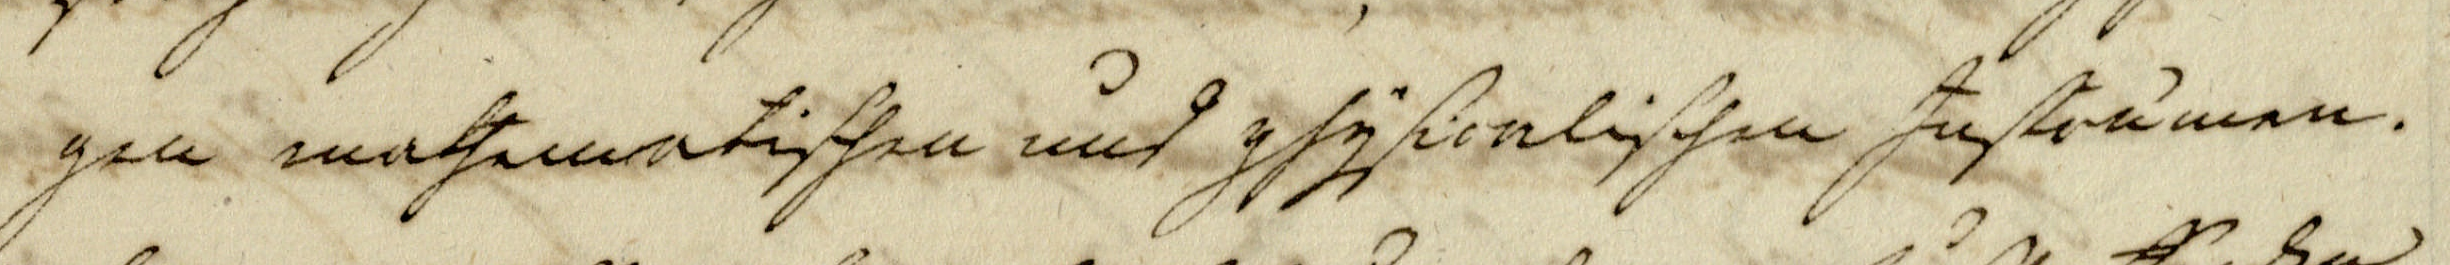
gen mathematischen und phÿsicalischen Instrumen¬
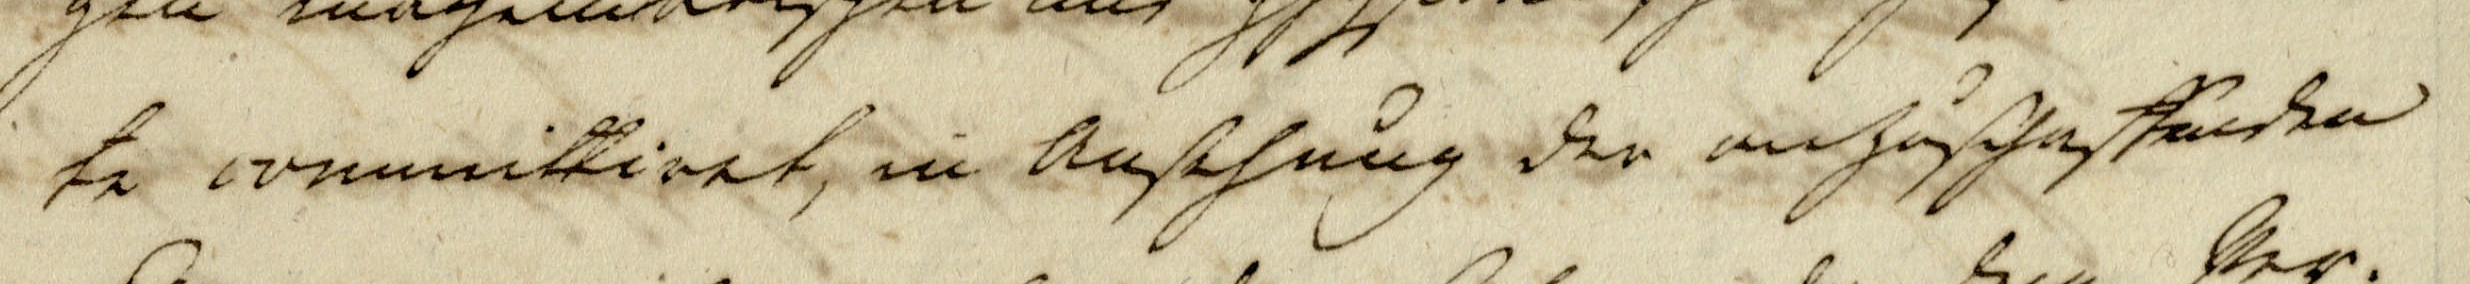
te committiret, in Ansehung der anzuschaffenden
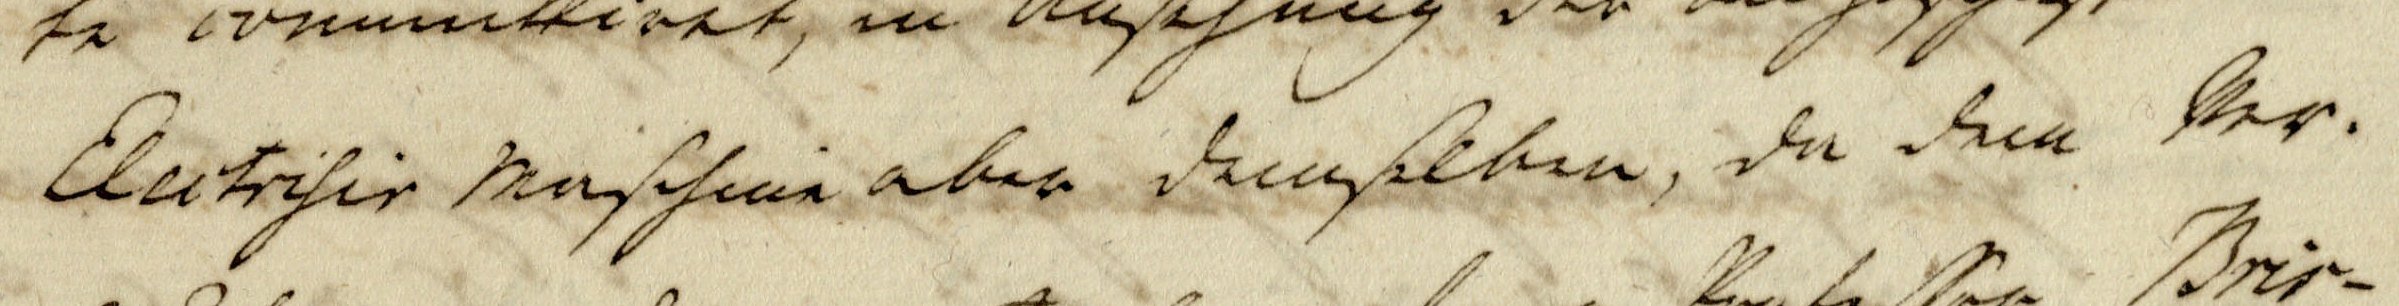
Electrisir Maschine aber demselben, da dem Ver¬
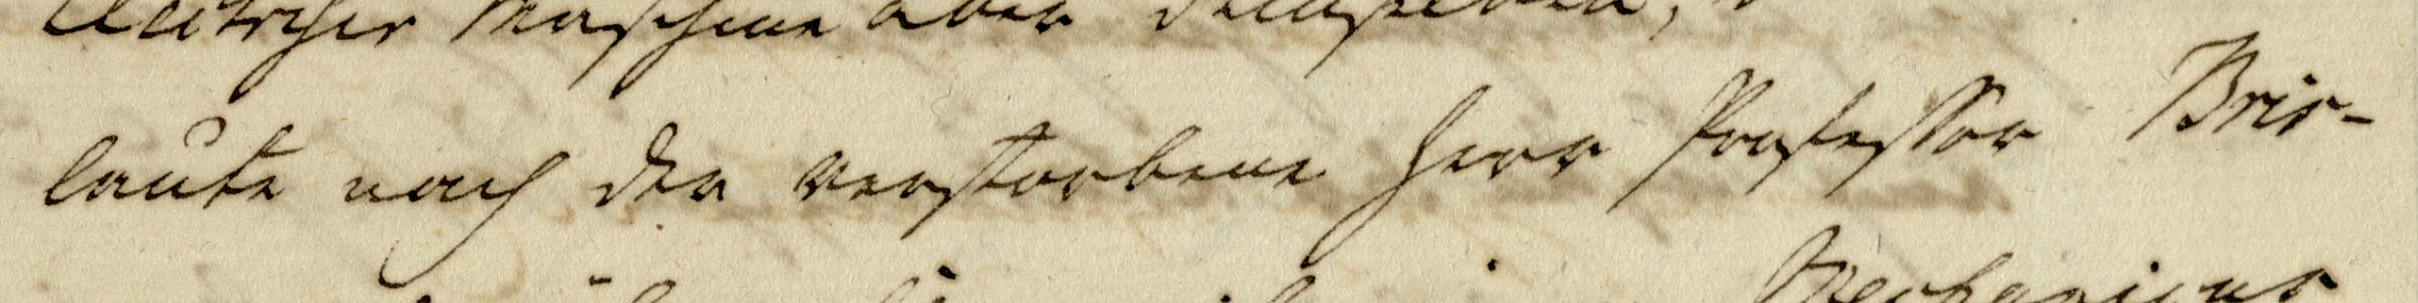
laute nach der verstorbene Herr Professor Bris¬
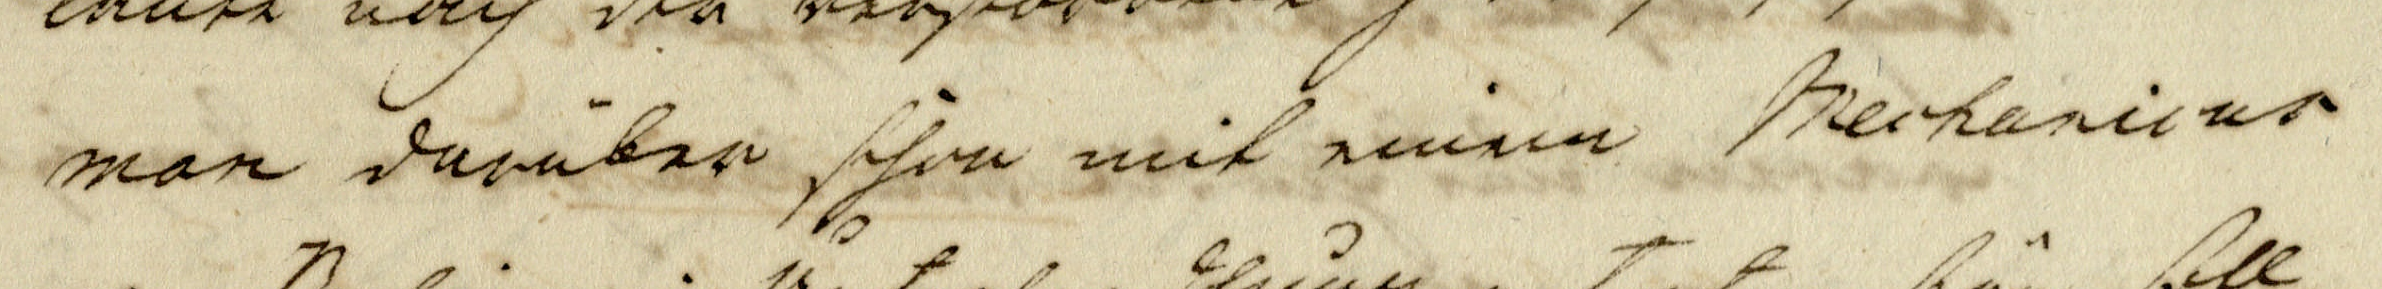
man darüber schon mit einem Mechanicus
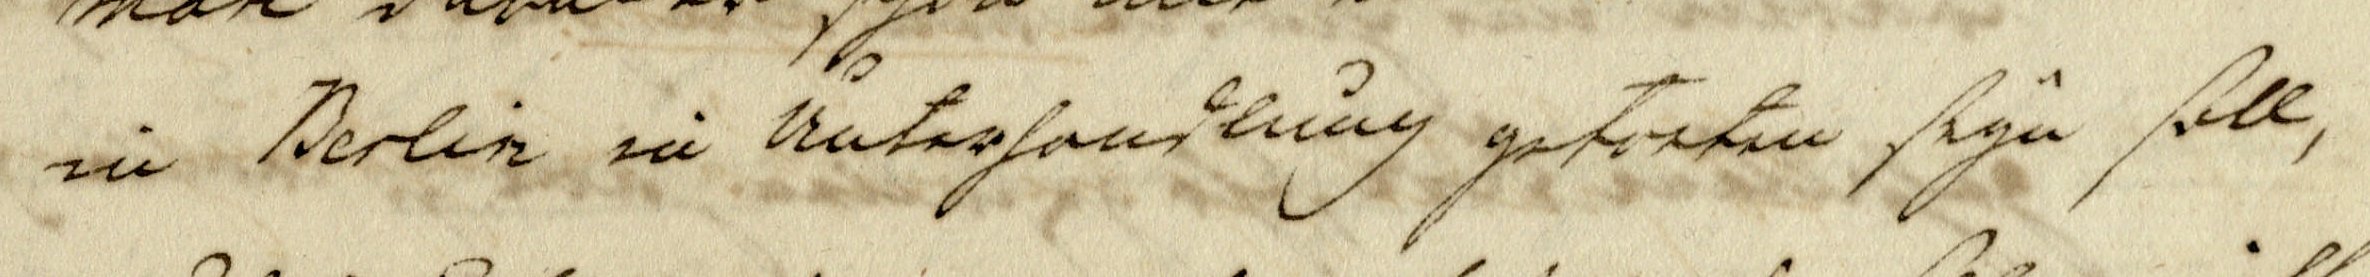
in Berlin in Unterhandlung getreten seÿn soll,
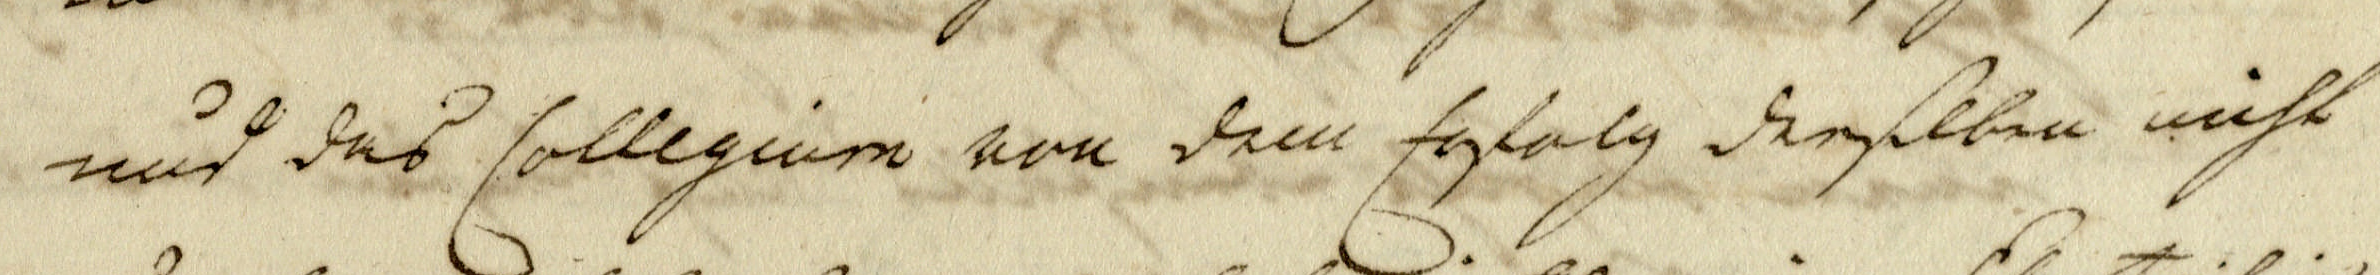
und das Collegium von dem Erfalg derselben nicht
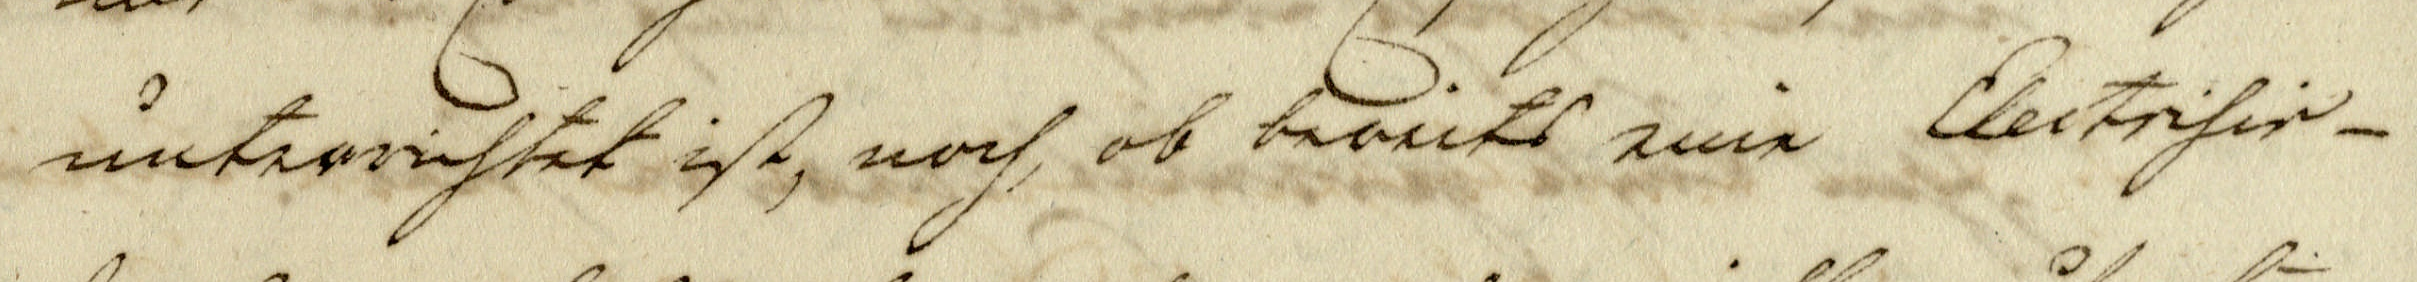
unterrichtet ist, noch ob bereits eine Electrisir-
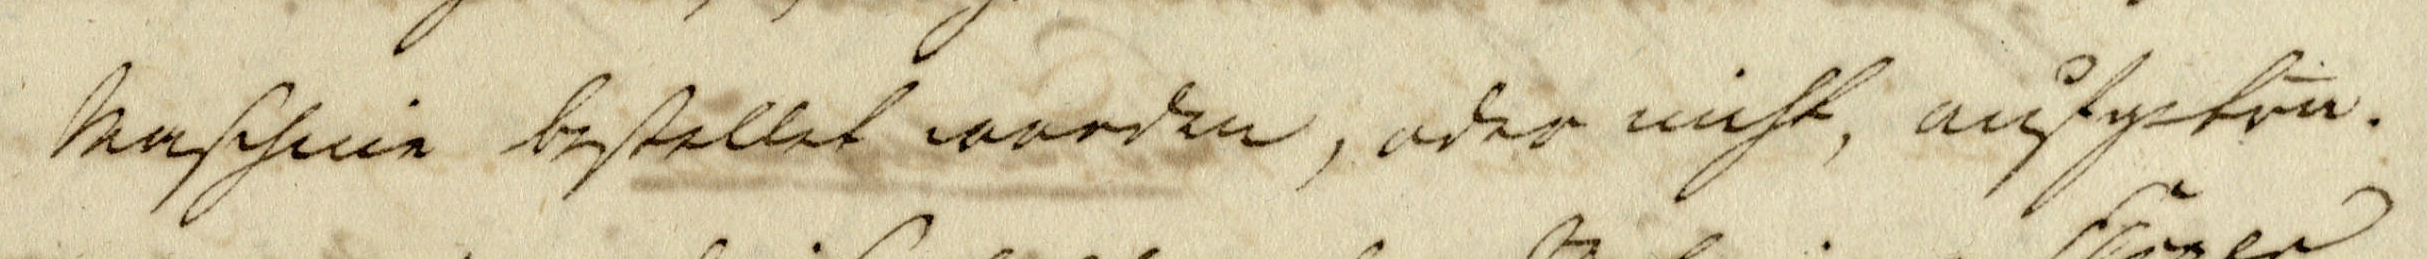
Maschine bestellet worden, oder nicht, aufgetra¬
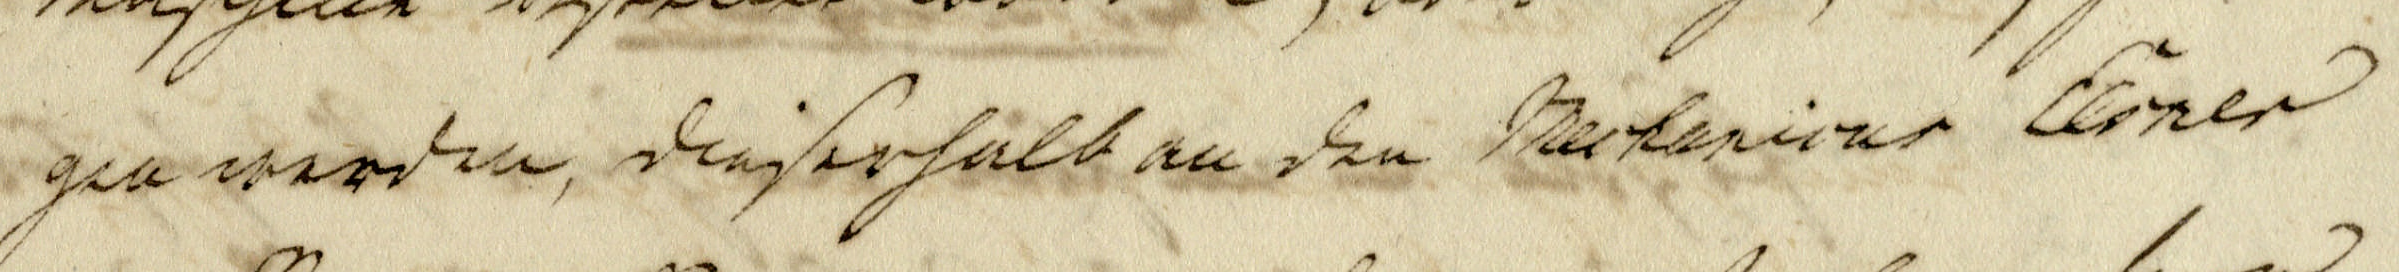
gen werden, dieserhalb an den Mechanicus Elsner
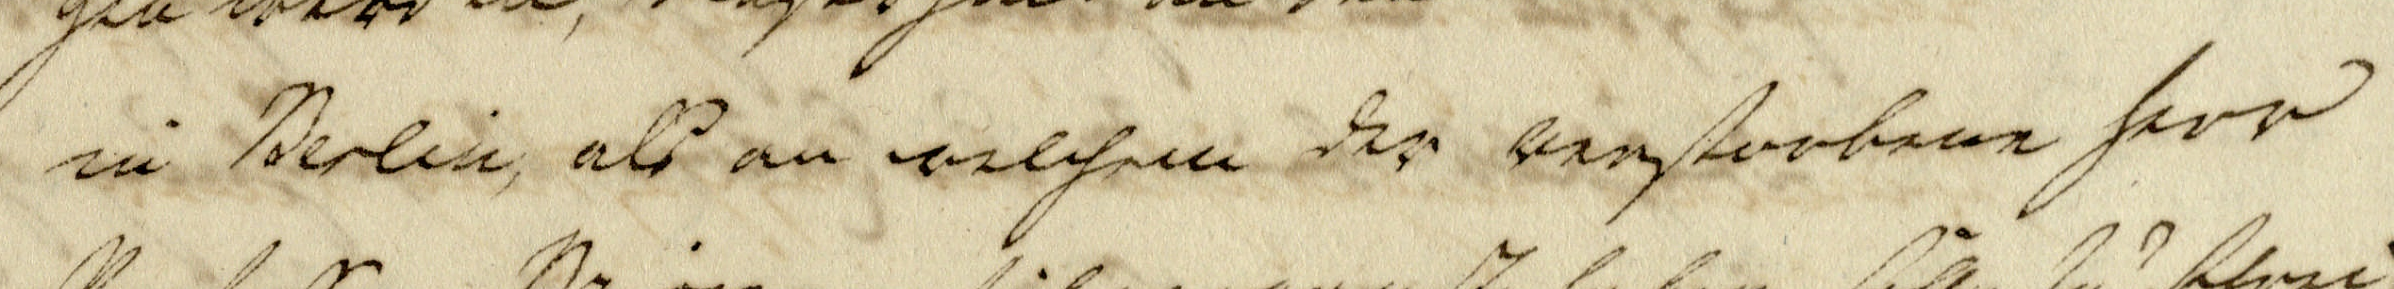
in Berlin, als an welchem der verstorbene Herr
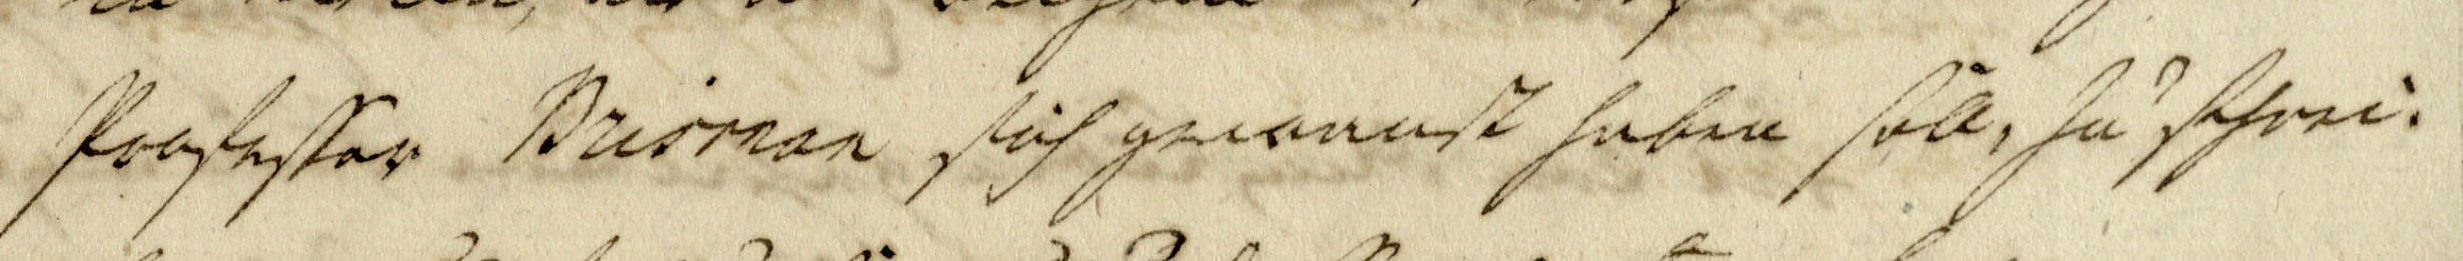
Professor Brisman sich gewandt haben soll, zu schrei¬
